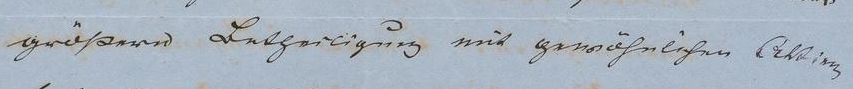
größern Betheiligung mit gewöhnlichen Aktien
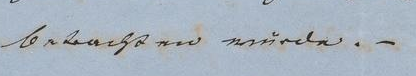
betrachten würde. –
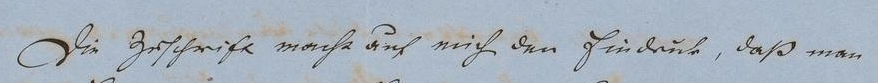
Die Zuschrift macht auf mich den Eindruk, daß man
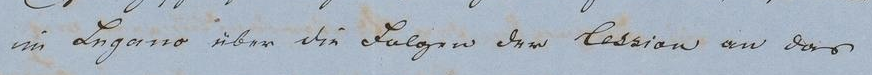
in Lugano über die Folgen der Cession an das
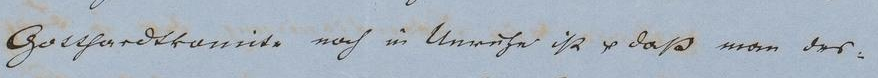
Gotthardtkomite noch in Unruhe ist & daß man des-
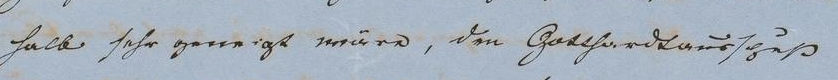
halb sehr geneigt wäre, den Gotthardtausschuß
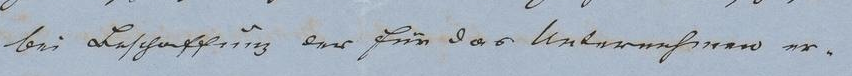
bei Beschaffung der für das Unternehmen er-
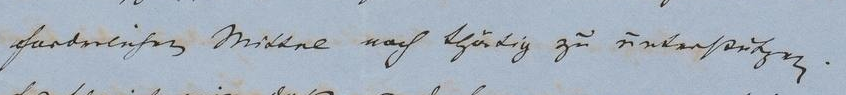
forderlichen Mittel noch thätig zu unterstützen.
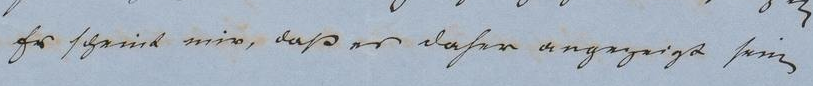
Es scheint mir, daß es daher angezeigt sein
